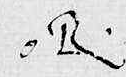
o R.
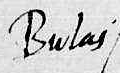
Bulas
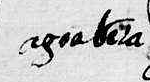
agoa bēta
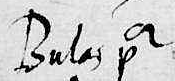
Bulas pa
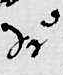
dro
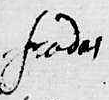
frades
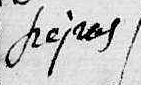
frejras
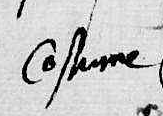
Costume
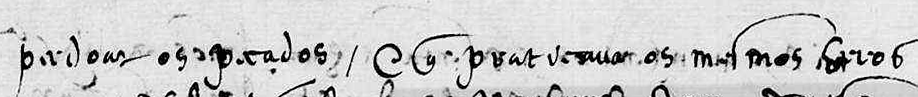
perdoar os pecados / e q̄ praticaua os mesmos Erros
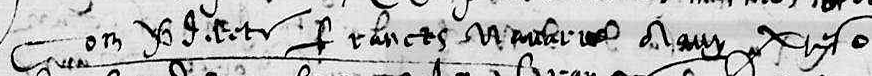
Com ꝟdolete frances nauarro Aquy preso
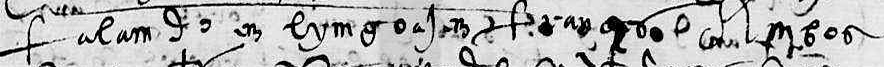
falamdo em lymgoaJem frances Ambos
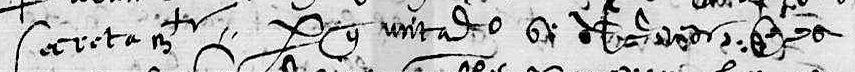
secretamte /. ꝑguntado se ꝟd_ete os
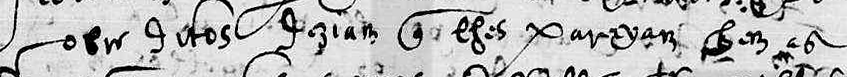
sobreditōs deziam q̅ lhes parecyam bem as
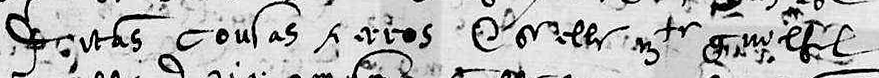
ditās cousas e erros e se elle mte guilhel
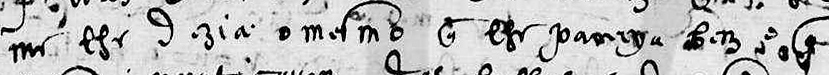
me lhe dezia o mesmo q̄ lhe parecya bem o q̅
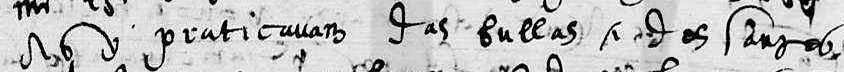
Asy praticauam das bullas e dos santos
